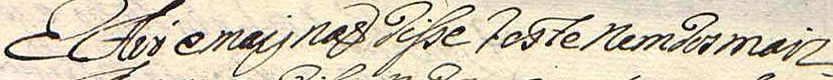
E Avó e mais naõ disse deste nem dos maiz
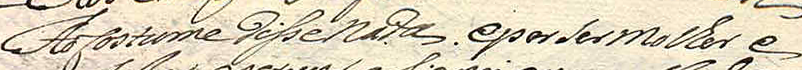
Ao Costume disse nada. e por ser molher e
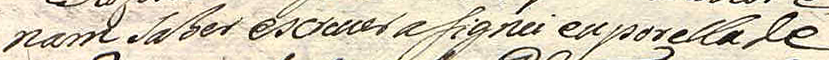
nam saber escreuer asignei eu por ella de
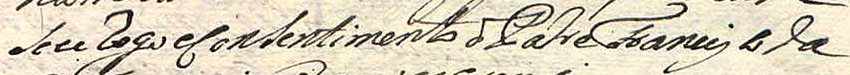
seu Rogo e Consentimento o Padre Francisco da
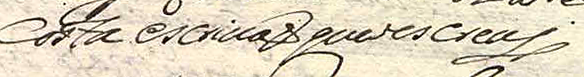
Costa escriuaõ que o escreuj
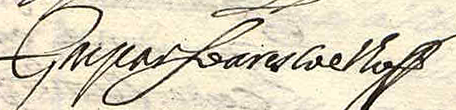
Gapar soares coelho
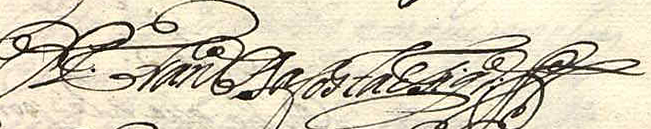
O P.e Franco Da Costa Figr.o
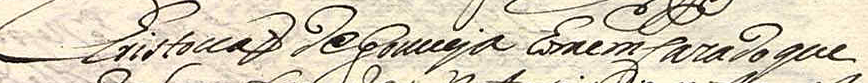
Christouaõ de Gouueja homem Cazado que
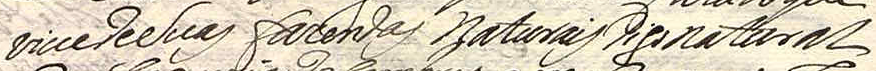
uiue de Suas fazendas naturais digo naturaL
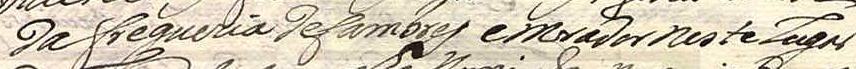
da freguezia de Cambres e morador neste Lugar
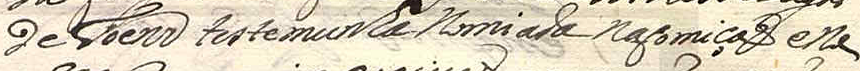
de Toenz testemunha Nomiada na Comiçaõ e no
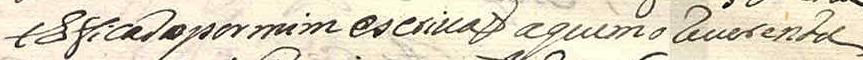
thificado por mim escriuaõ a quem o Reuerendo
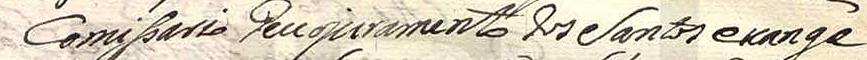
Comissario deu o juramento dos Santos euange
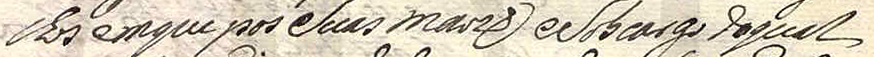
lhos em que pos Suas maoz e Sobcargo do qual
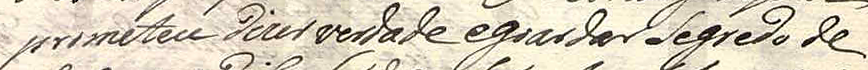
prometeu dizer verdade e goardar segredo de
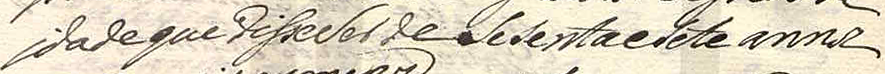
idade que disse ser de sesenta e sete annoz
